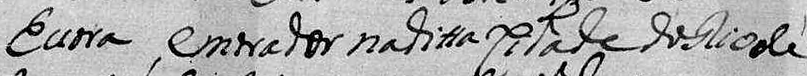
Euora, e morador na ditta Cidade do Rio de
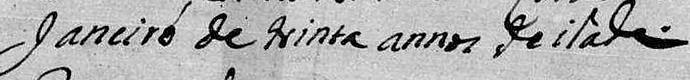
Janeiro de trinta annos de idade.
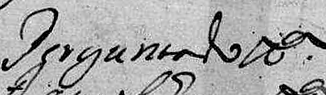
Perguntado &.a
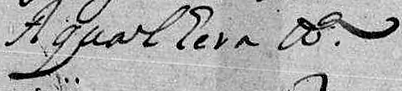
A qual hera &.a
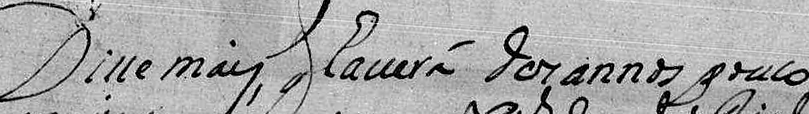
Disse mais, q̄ hauerá dez annos pouco
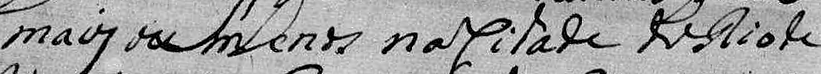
mas ou menos na Cidade do Rio de
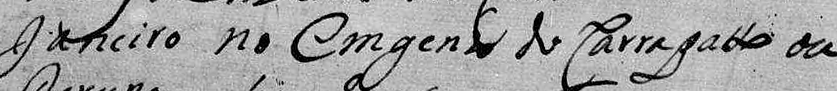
Janeiro no Emgenho do Carrapatto ou
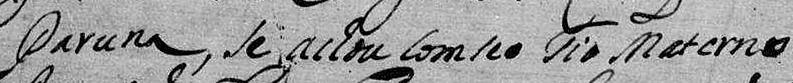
Paruna, se achou com seo Tio Materno
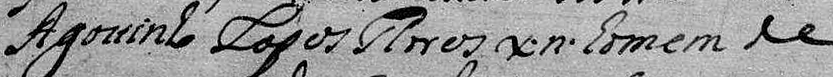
Agostinho Lopes Flores x. n. homem de
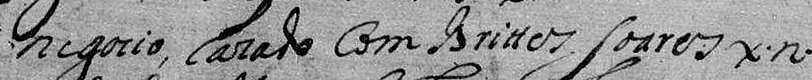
negocio, cazado com Brittes soares x. n.
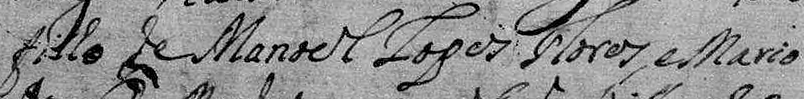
filho de Manoel Lopes Flores e Mario
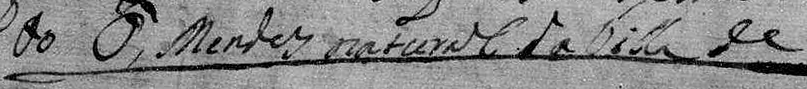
do O, Mendez natural da Vila de
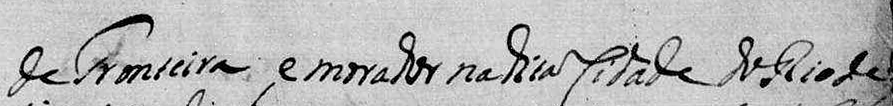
de Fronteira, e morador na dita Cidade do Rio de
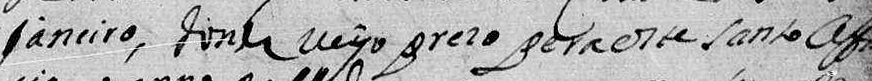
Janeiro, donde ueyo prezo pera este santo Offi
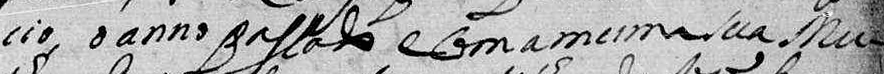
cio o anno passado, e com a mesma sua Mu
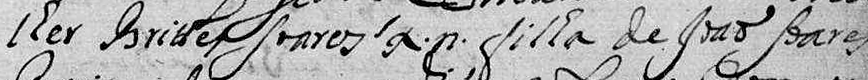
lher Brittes soares x. n. filha de Joaõ soares
